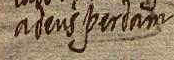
a deus perdam
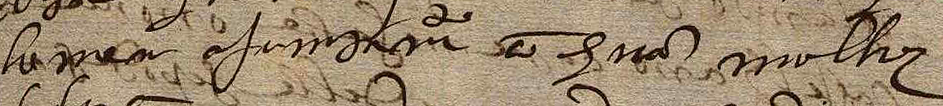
homem aJumtamto cō huā molher
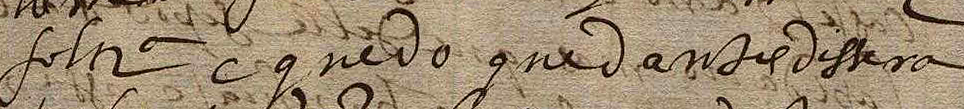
soltra e que do que dantes dissera
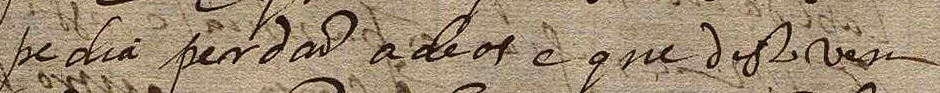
pedia perdaõ a deos e que disto vem
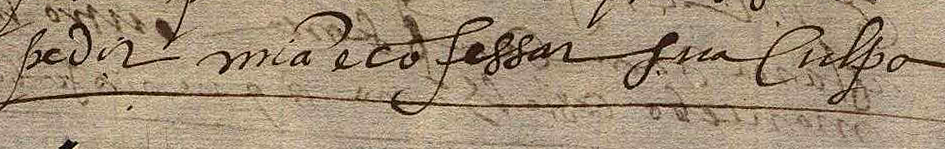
pedir miā e cōfessar sua Culpa
